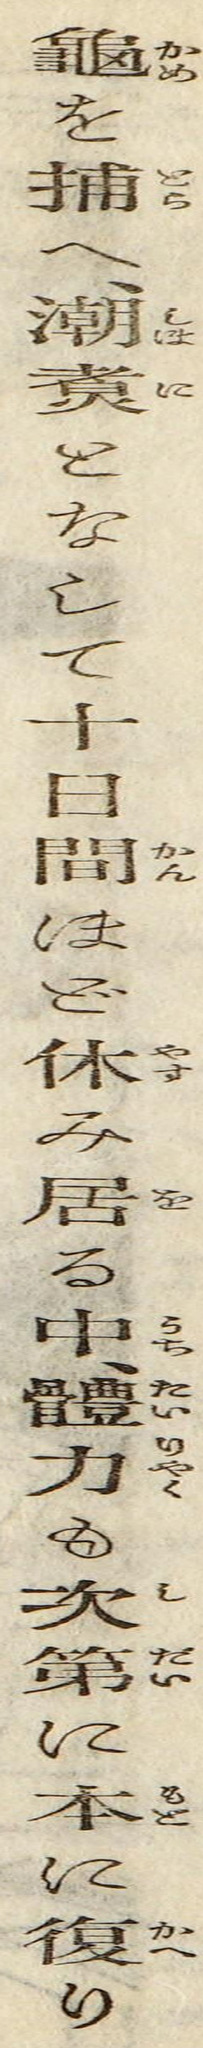亀を捕へ、潮煮となして十日間ほど休み居る中、体力も次第に本に復り
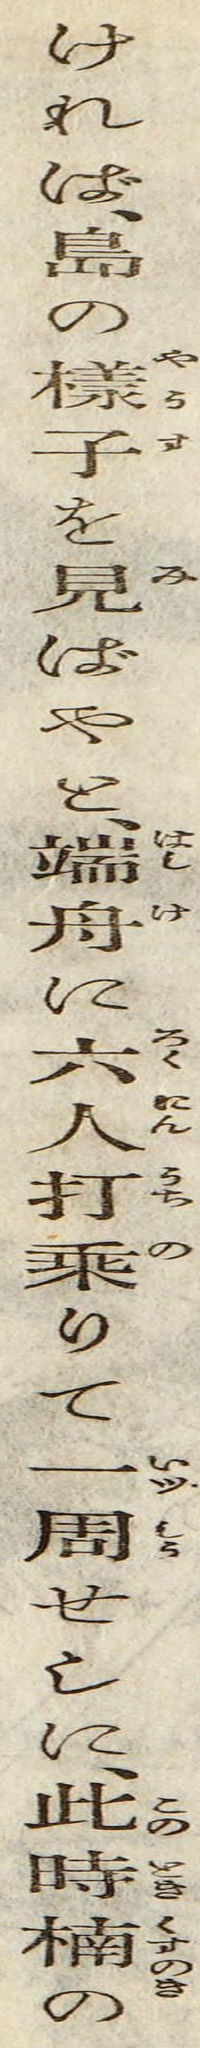ければ、島の様子を見ばやと、端舟に六人打乗りて一周せしに、此時楠の
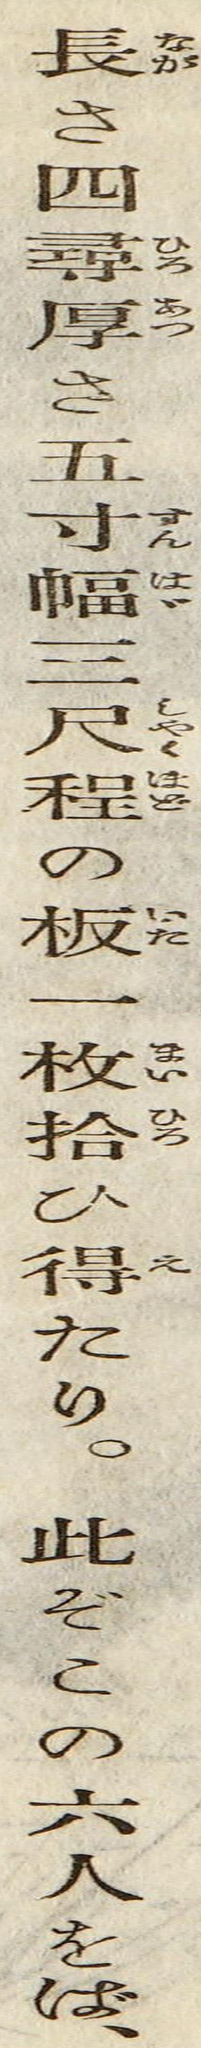長さ四尋厚さ五寸幅三尺程の板一枚拾ひ得たり。此ぞこの六人をば、
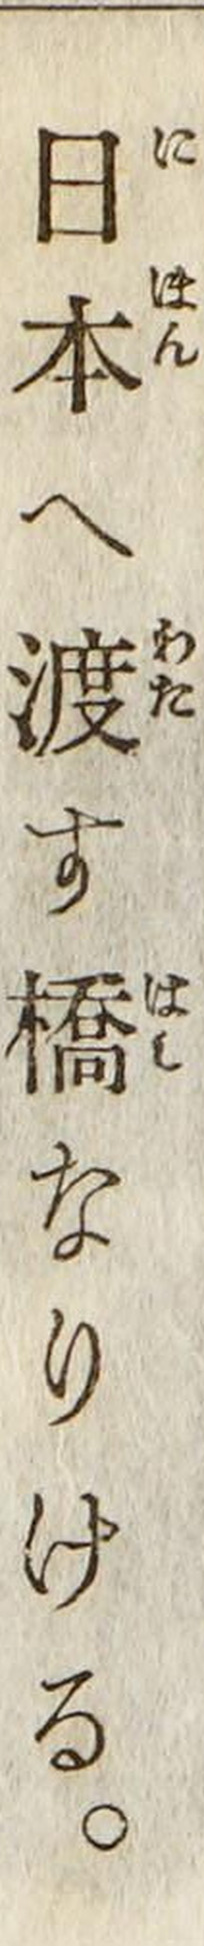日本へ渡す橋なりける。
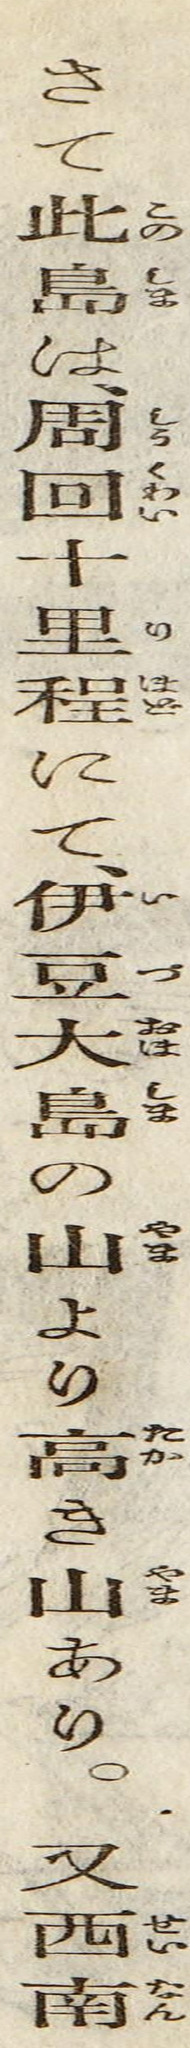さて此島は、周回十里程にて、伊豆大島の山より高き山あり。又西南
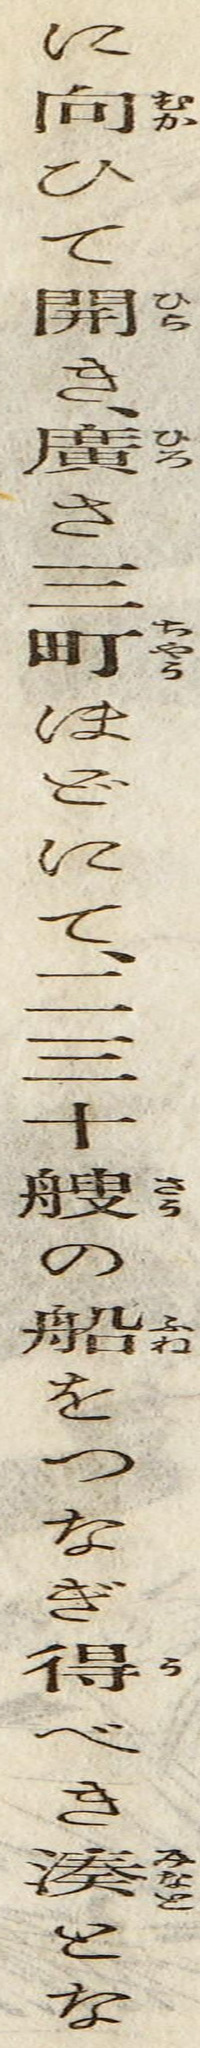に向ひて開き、広さ三町ほどにて、二三十艘の船をつなぎ得べき湊とな
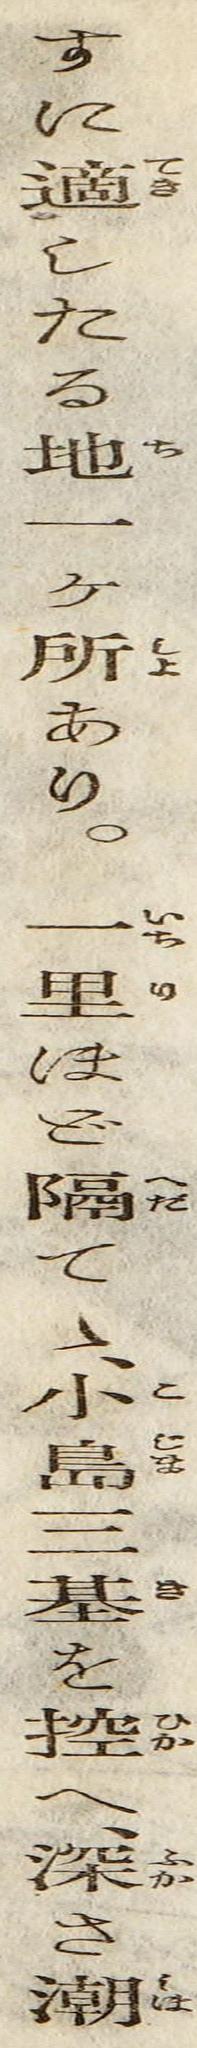すに適したる地一ケ所あり。一里ほど隔てゝ、小島三基を控へ、深さ潮
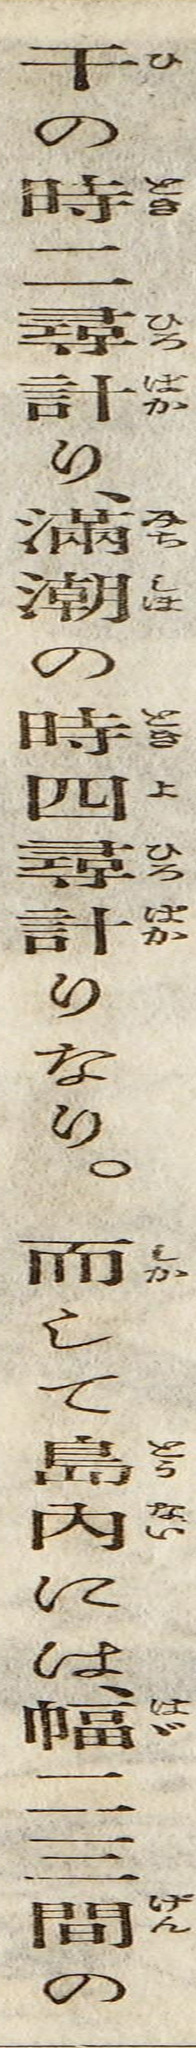干の時二尋計り、満潮の時四尋計りなり。而して島内には、幅二三間の
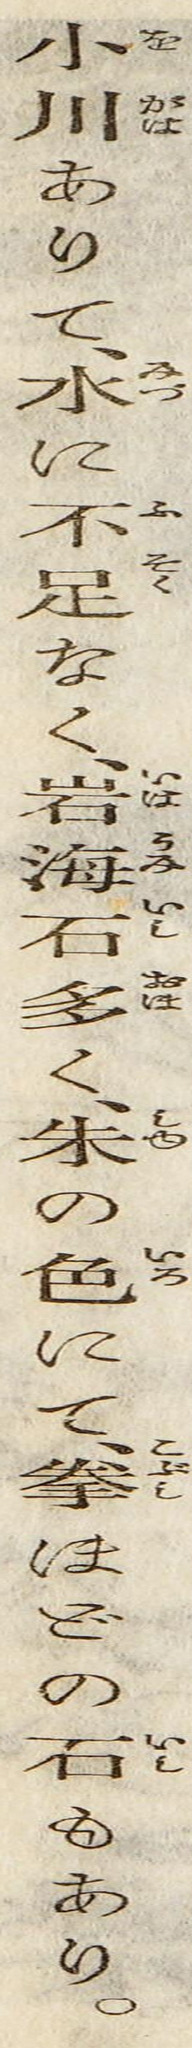小川ありて、水に不足なく、岩海石多く、朱の色にて、拳ほどの石もあり。
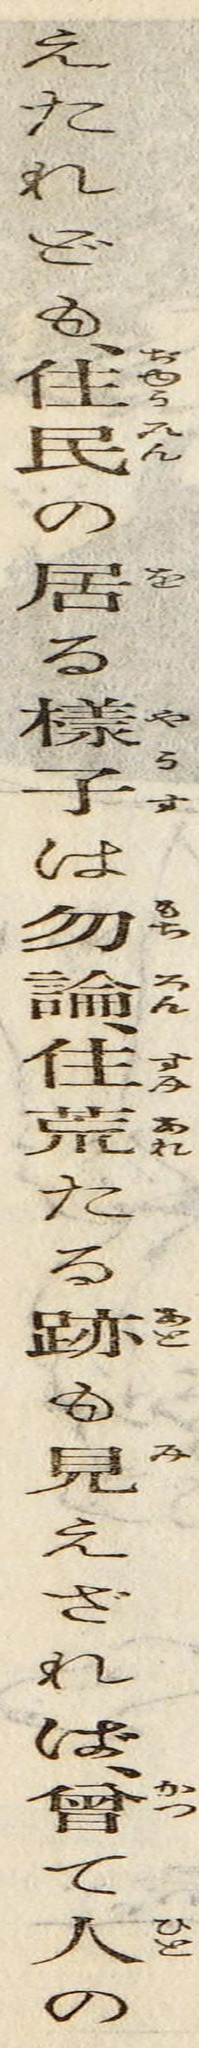えたれども、住民の居る様子は勿論、住荒たる跡も見えざれば、曽て人の
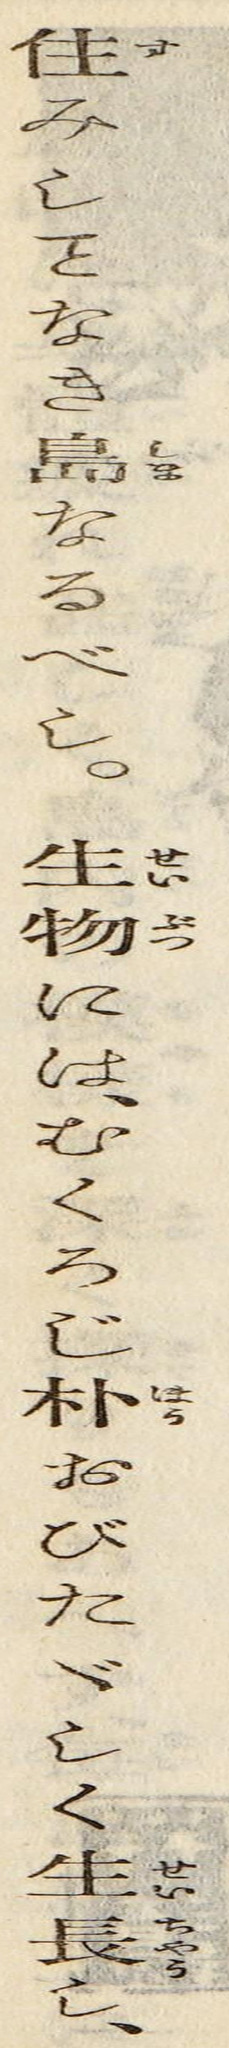住みしことなき島なるべし。生物には、むくろじ朴おびたヾしく生長し、
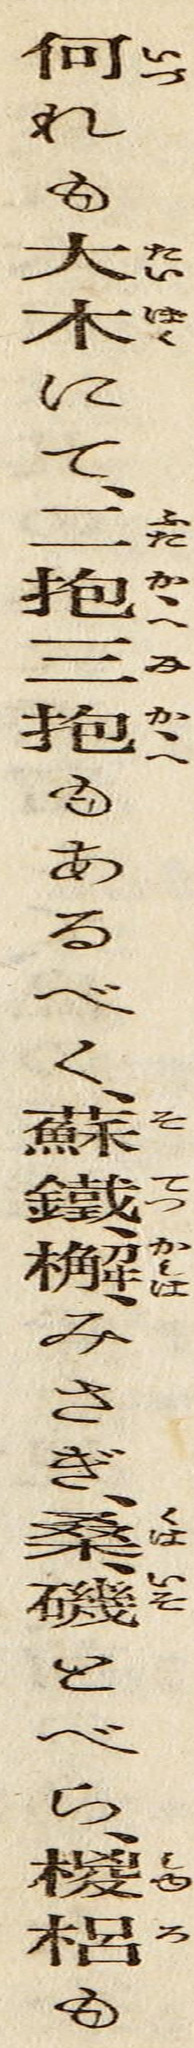何れも大木にて、二抱三抱もあるべく、蘇鉄、檞、みさぎ、桑、磯とべら、棕梠も
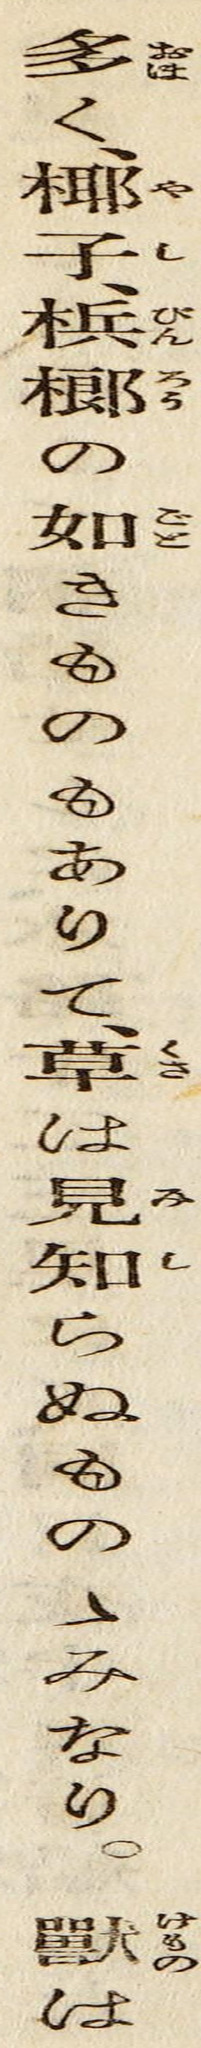多く、椰子、梹榔の如きものもありて、草は見知らぬものゝみなり。獣は
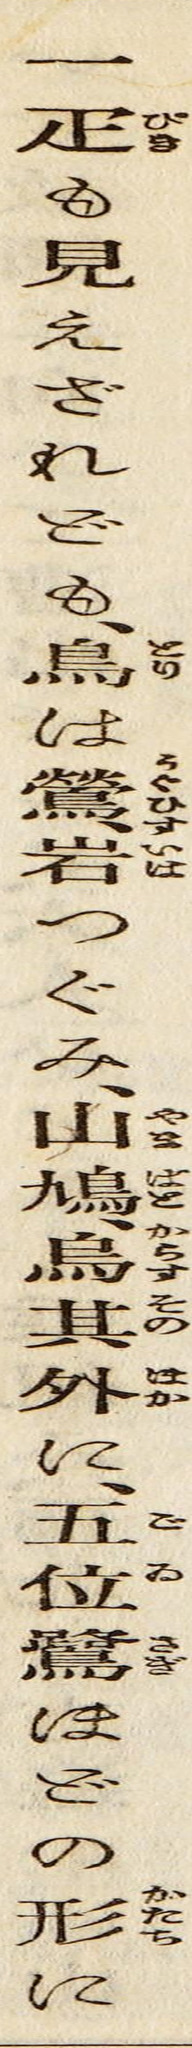一疋も見えざれども、鳥は鶯、岩つぐみ、山鳩、烏其外に、五位鷺ほどの形に
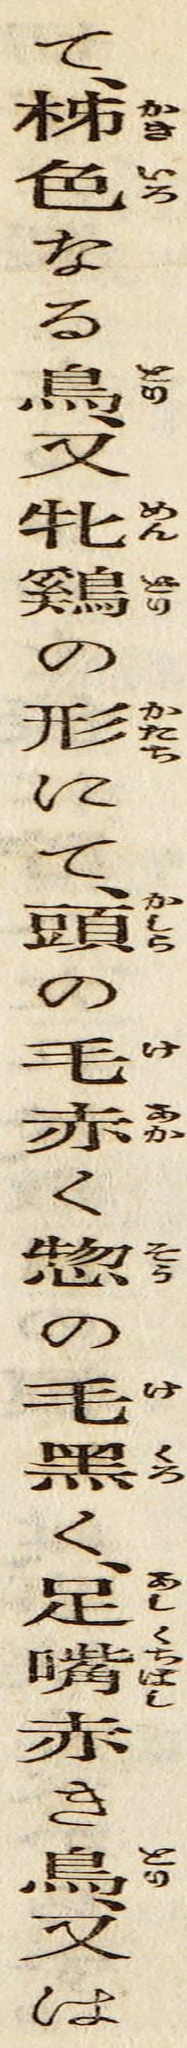て、柿色なる鳥、又牝鶏の形にて、頭の毛赤く総の毛黒く、足嘴赤き鳥、又は
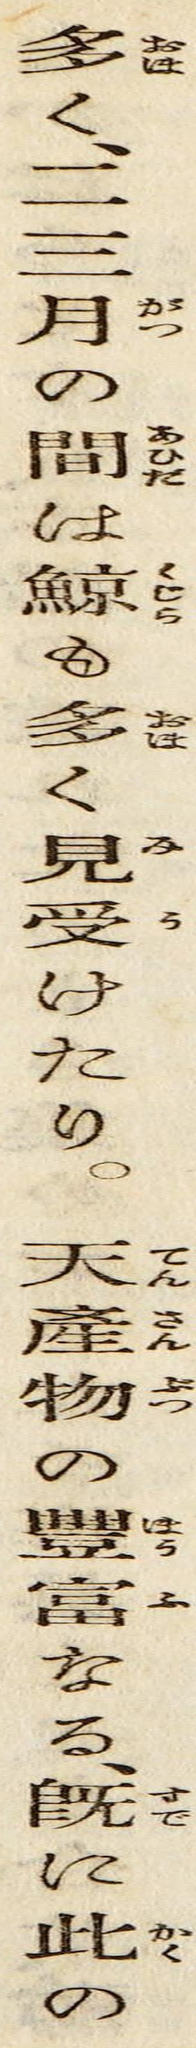多く、二三月の間は鯨も多く見受けたり。天産物の豊富なる、既に此の
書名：日本漂流譚
